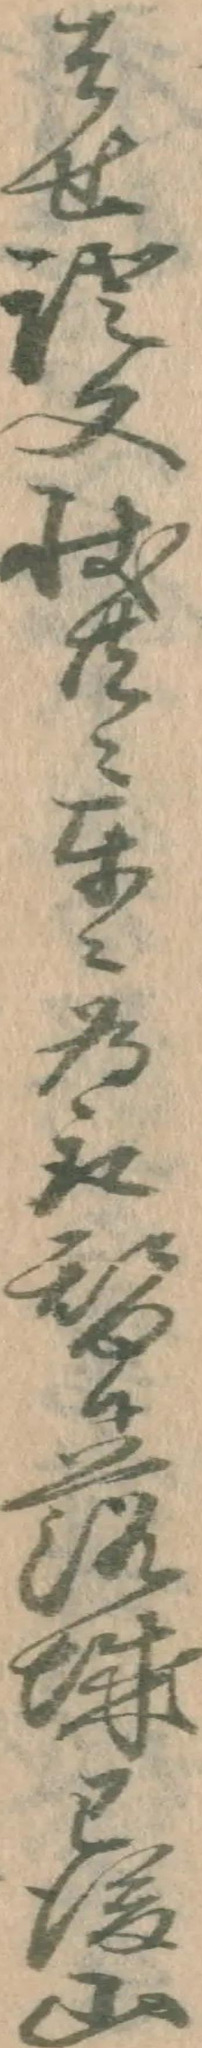者せ證文状共に互に為取替候落城已後山
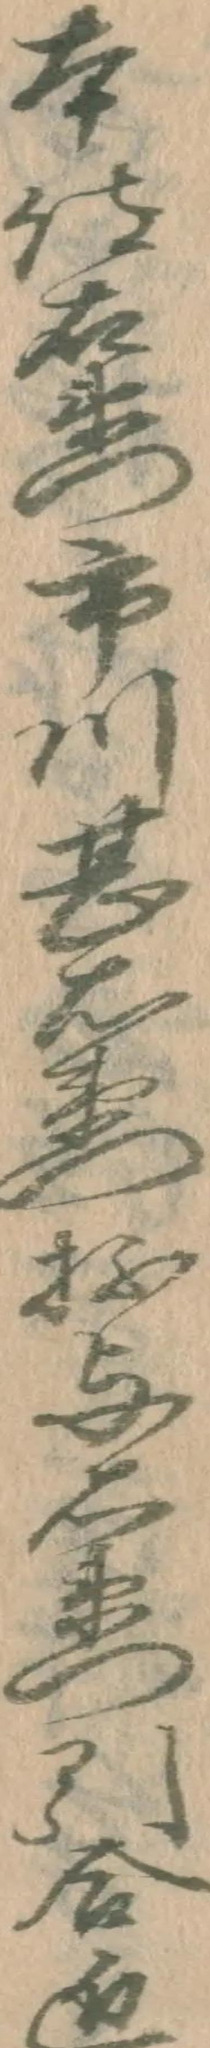本佐右衛門市川甚右衛門抔与右衛門引合近
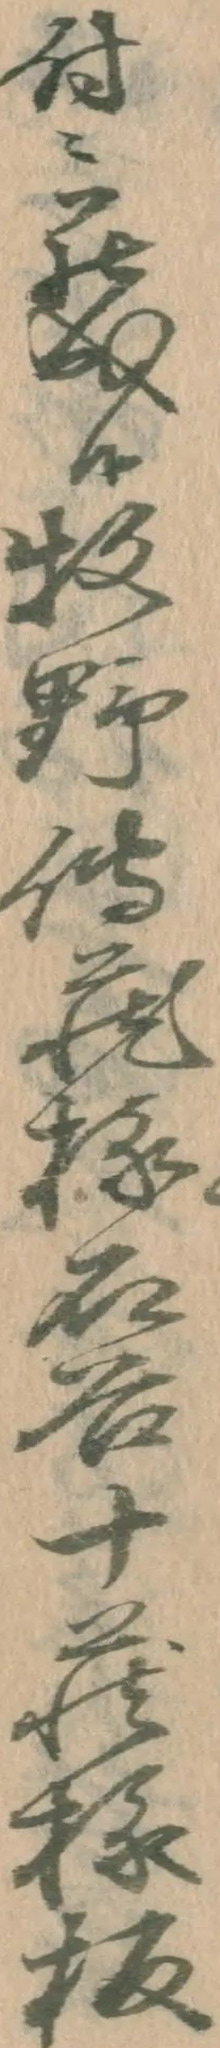付に罷成候牧野伝蔵様石谷十蔵様板
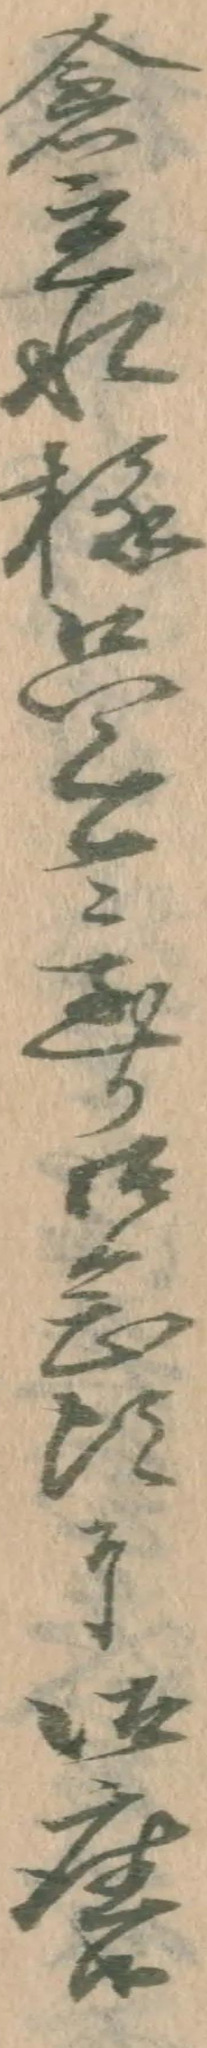蔵主水様只今に至り御念頭に御座候
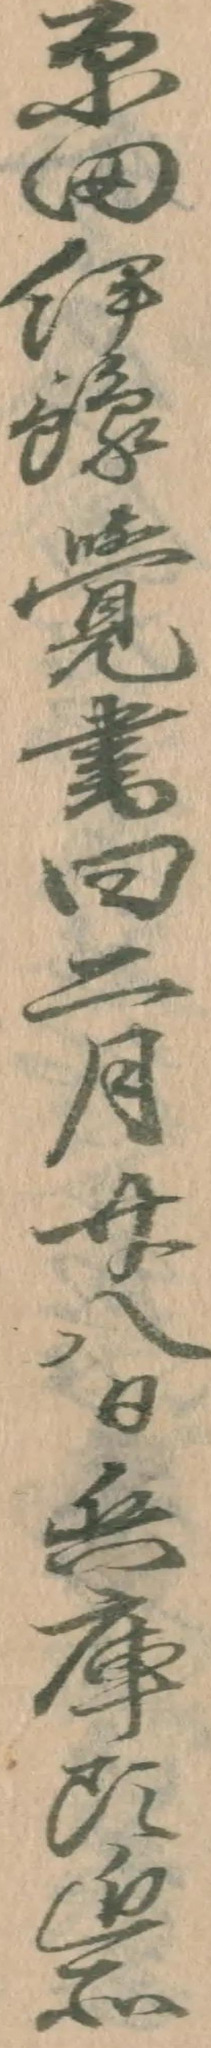原田伊予覚書曰二月廿八日兵庫頭近所
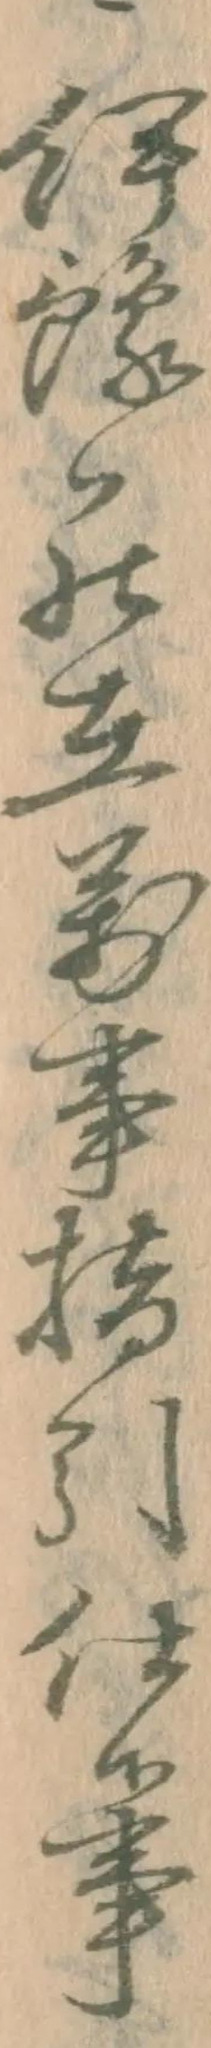に伊予罷在万事指引仕候事
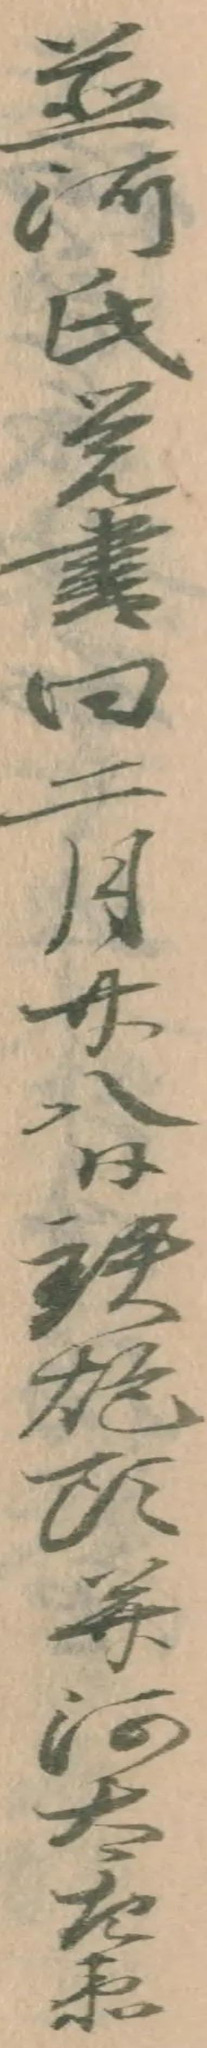並河氏覚書曰廿八日鉄炮頭並河太左衛
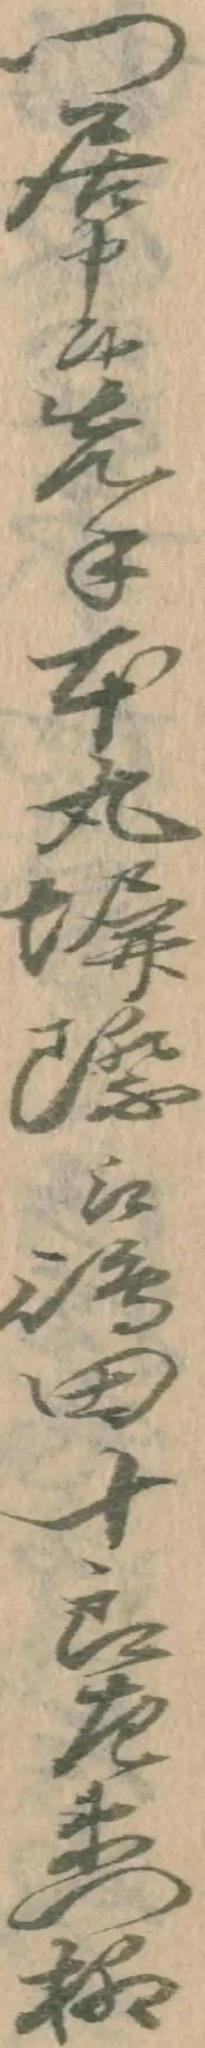門居申候先手本丸塀際江島田十郎左衛門柳
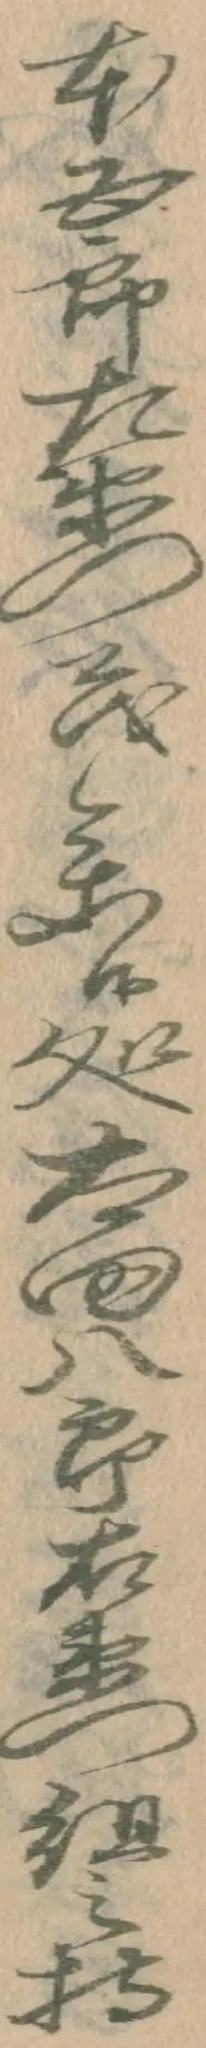本五郎左衛門茂参候処太田八郎右衛門組之持
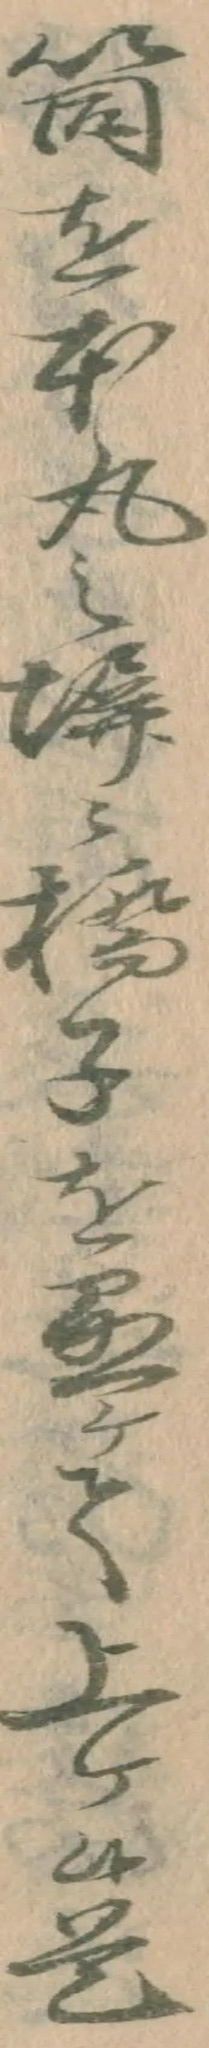筒を本丸之塀に橋子を懸けて上け候是
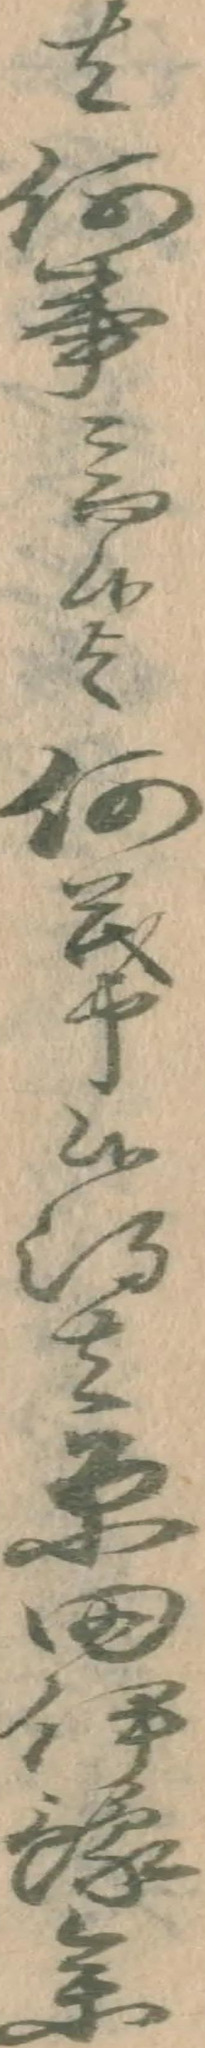者何事に而候与何茂申候得者原田伊予参
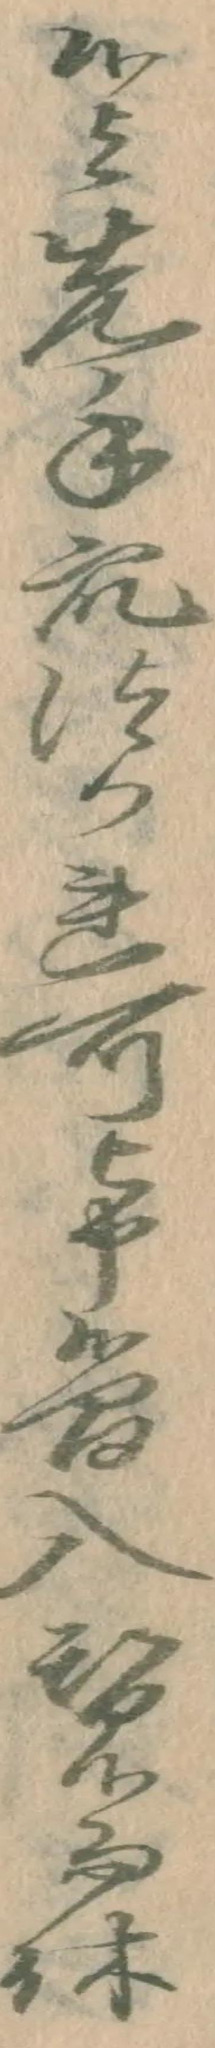候与先手衆徒か連可被申候間入替候而休
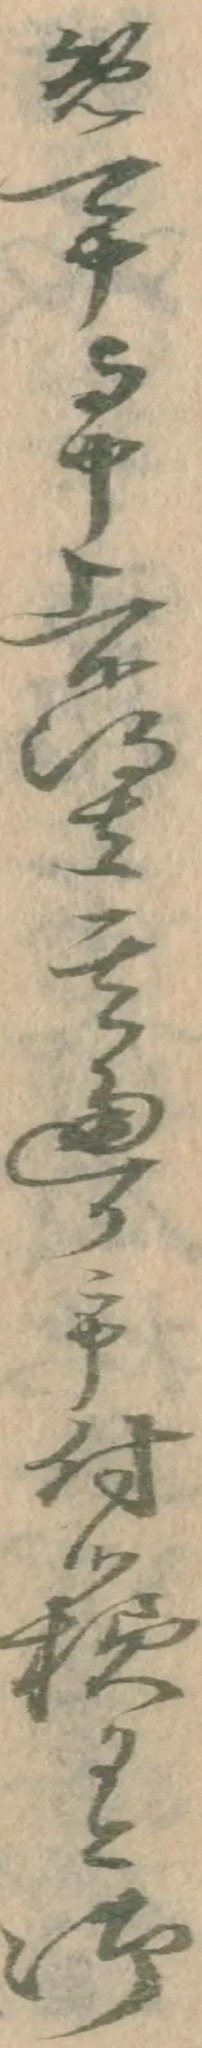免可申与申上候得者其通りに申付候様尓と御
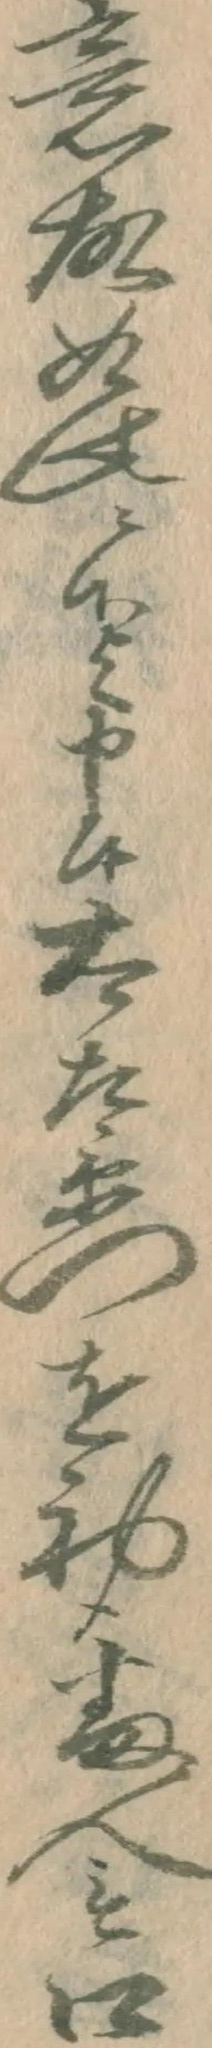意故如此に候与申候太左衛門を初め番人も口
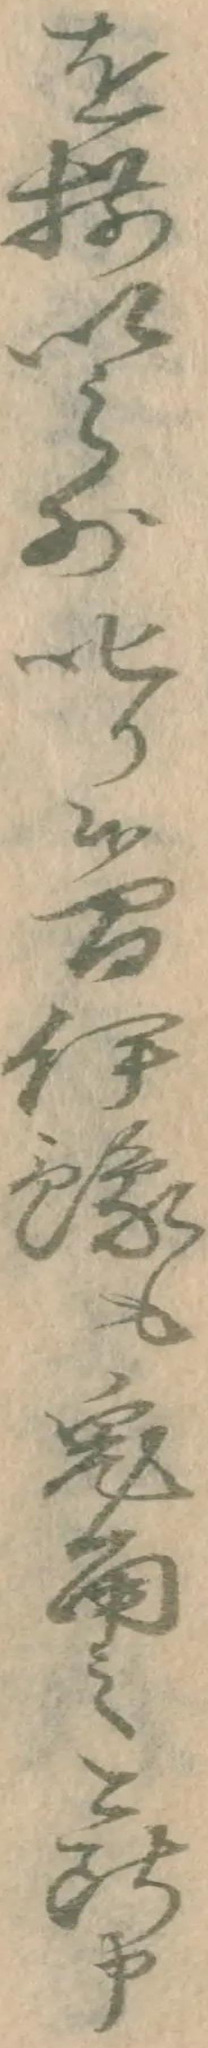を揃以之外叱り候間伊予も兎角之と申
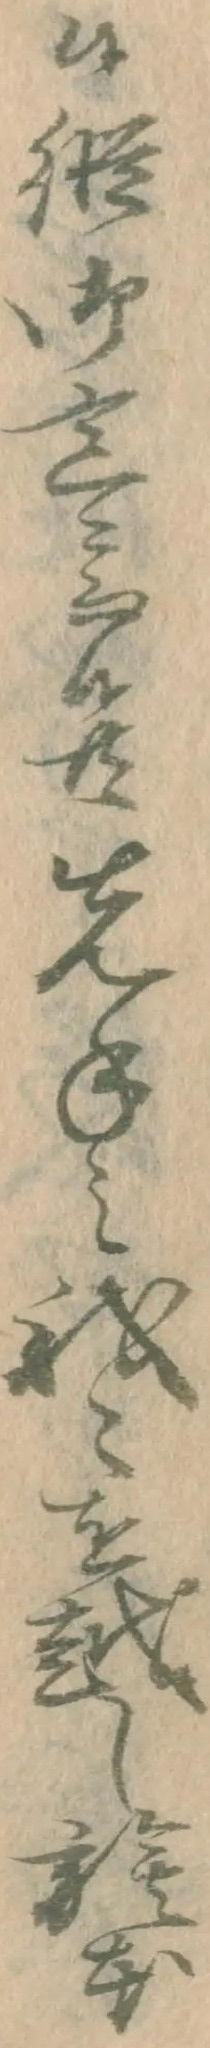候十縦御意に而候共先手之我々を越し旗本
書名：切支丹御退治記 49巻. [8]
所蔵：国立国会図書館 National Diet Library, JAPAN
